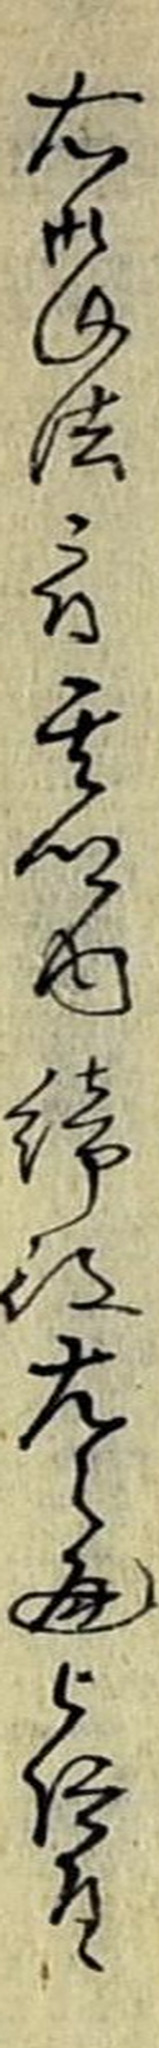右御趣法に付其郷内締役左之通被仰付候
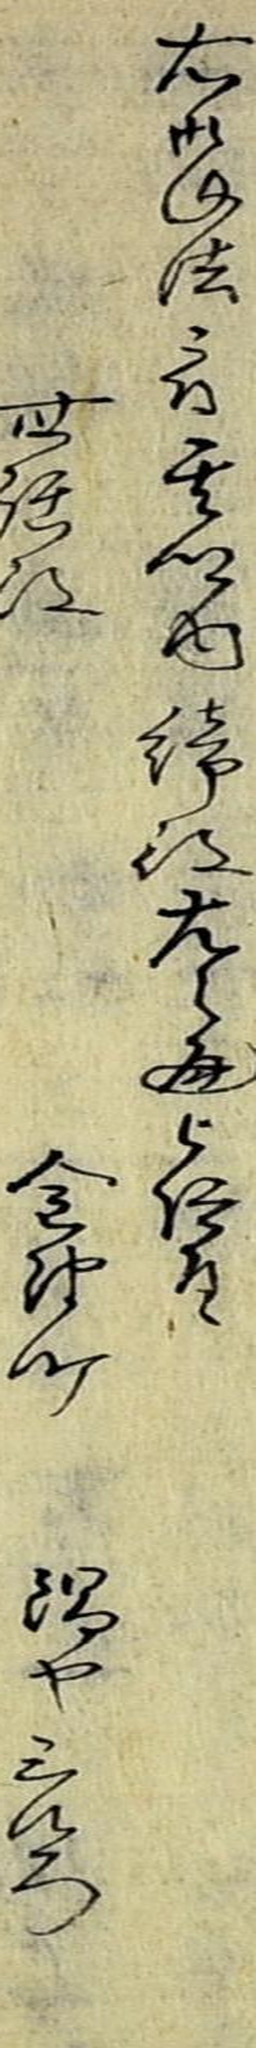世話役金津町鍋や三左衛門
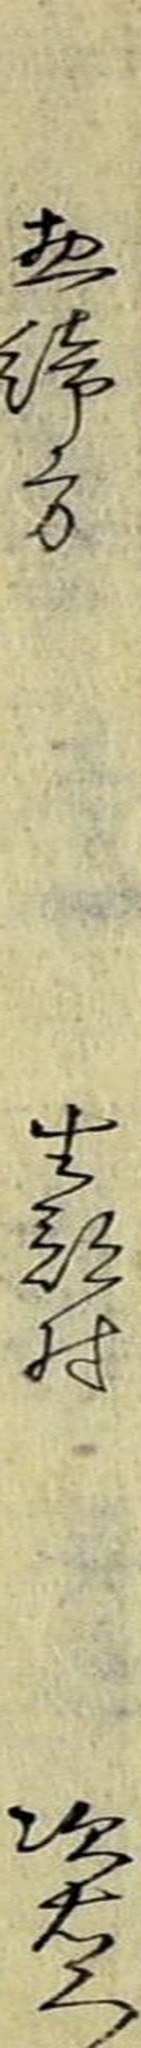惣締方生部村次右衛門
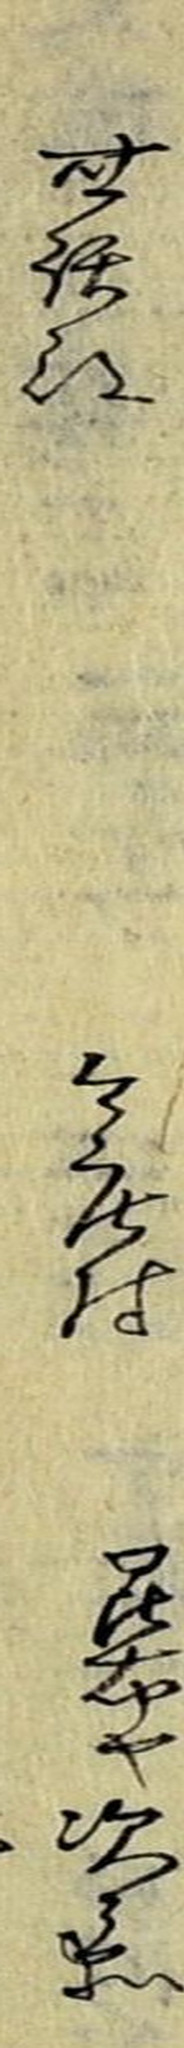世話役今庄村昆布や次兵衛
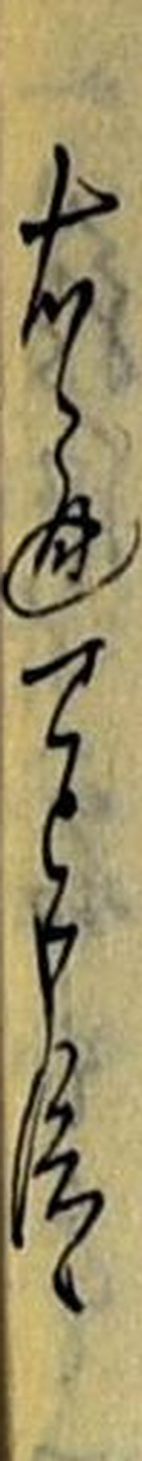右之通可被申渡候
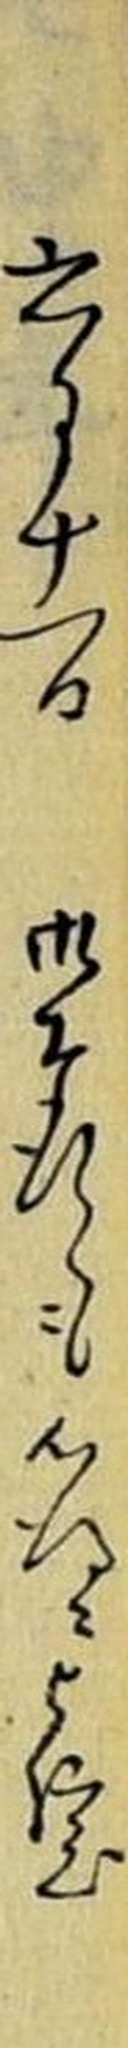六月十一日御奉行へも心得に被仰出
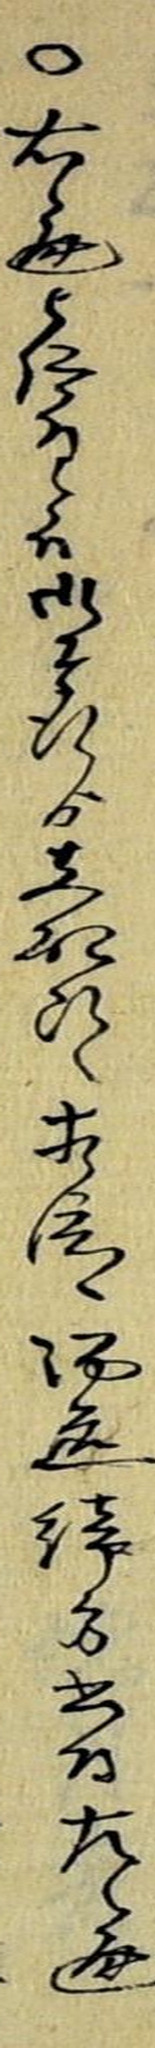○右之通被仰付候に付御奉行ゟ支配頭へ相渡候酒造締方書付左之通
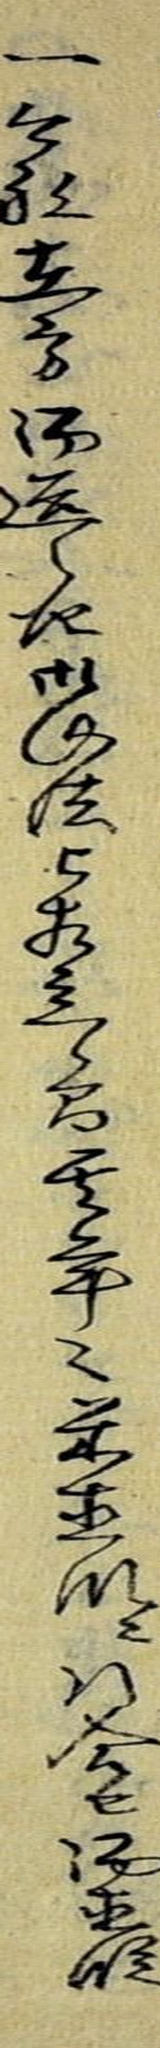一今般在方酒造之儀御趣法被相立候間其年々米直段に引合せ酒直段
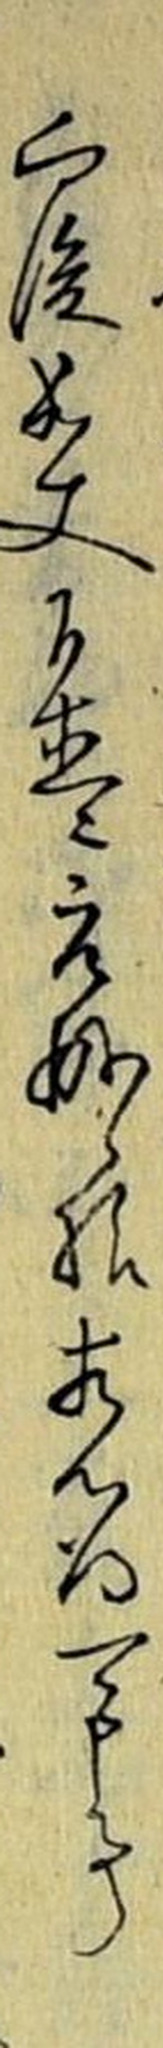向後成丈下直に取扱候様相心得可申事
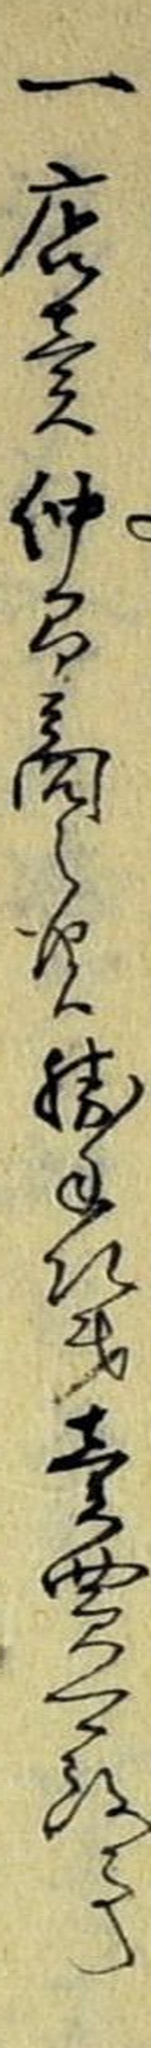一店売仲間商之儀は勝手次第売買可致事
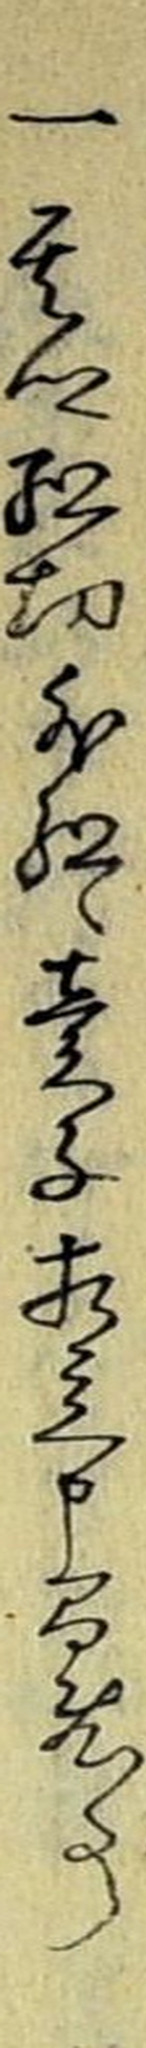一其郷組切外組へ売子相立申間敷事
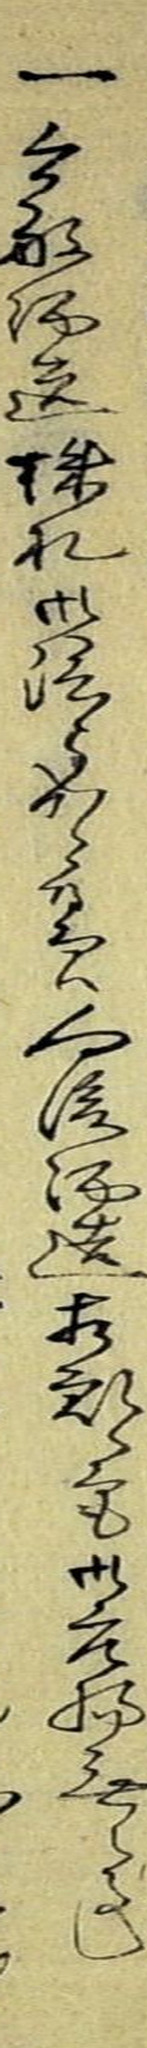一今般酒造株札御渡被成候に付而は向後酒造相願候而も御取揚無之事
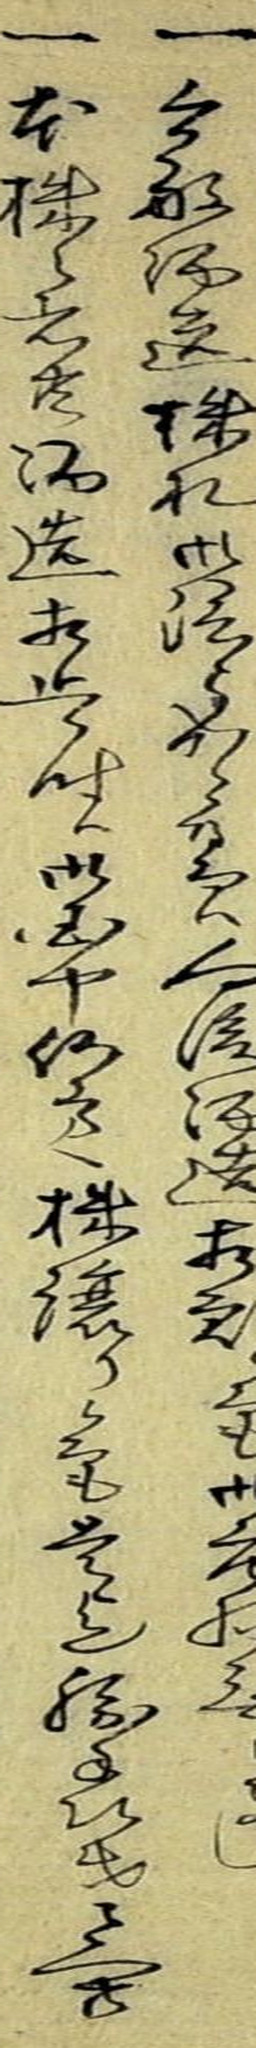一本株之者共酒造相止候時は御国中何方へ株譲り候而も是迄勝手次第に候へ共
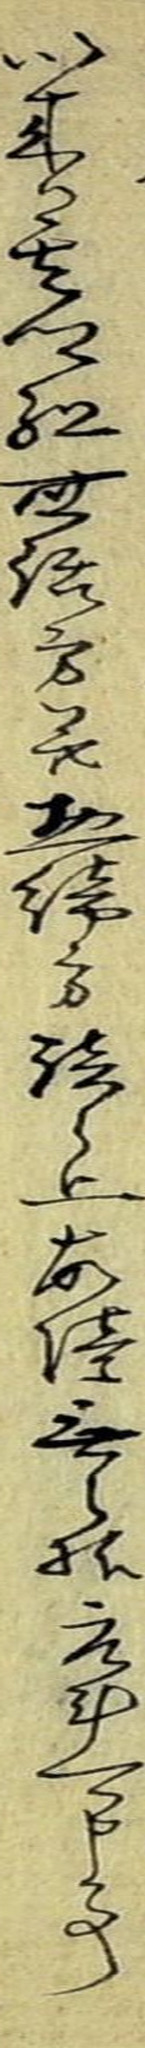以来は其郷組世話方井惣締方談之上故障無之様取斗可申事
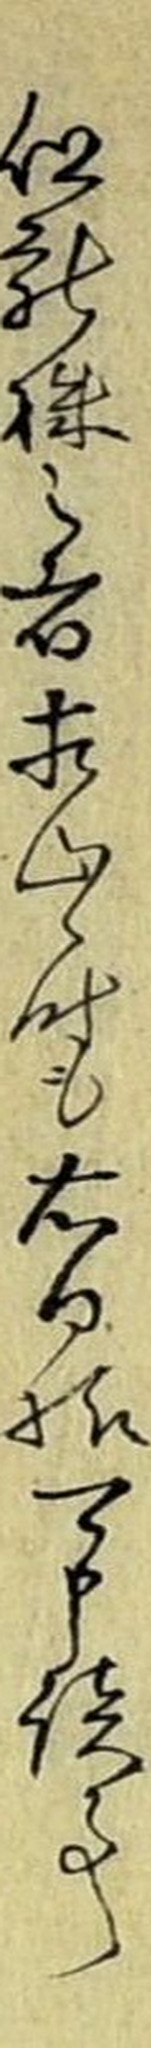但新株之者相止候時も右同様可申談事
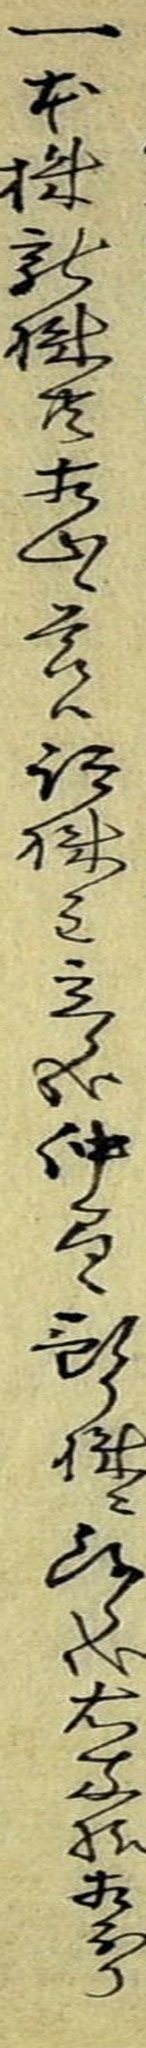一本株新株共相止候節は跡株主立候哉仲間へ預り株に致候哉右両様相分り
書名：命令之部 四
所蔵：福井県文書館 Fukui Prefectural Archives
